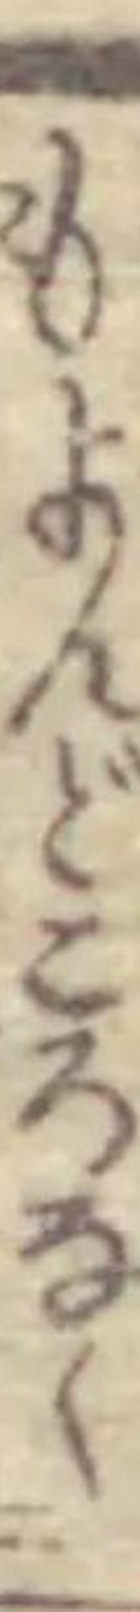もよんどころなく
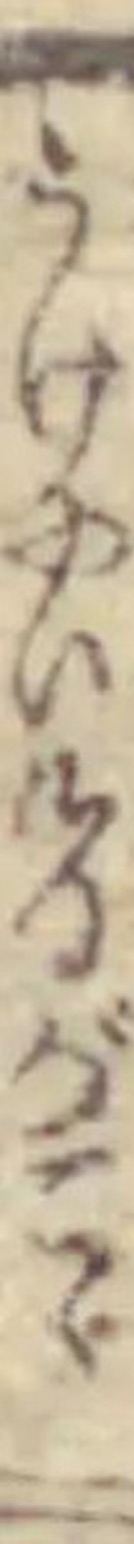うけやいけるがこゝ
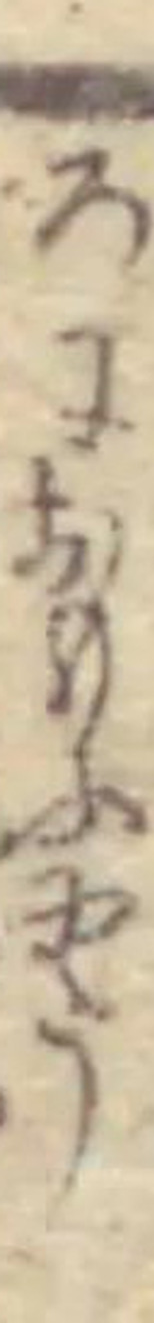ろにおもふやう
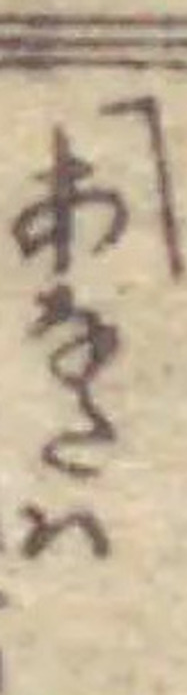〽あなたは
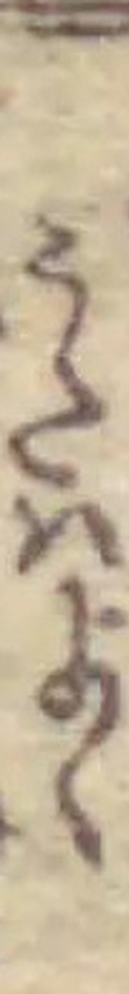うたはよく
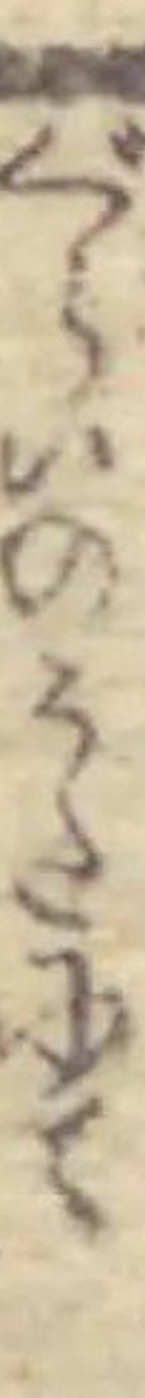ぐらいのうたにて
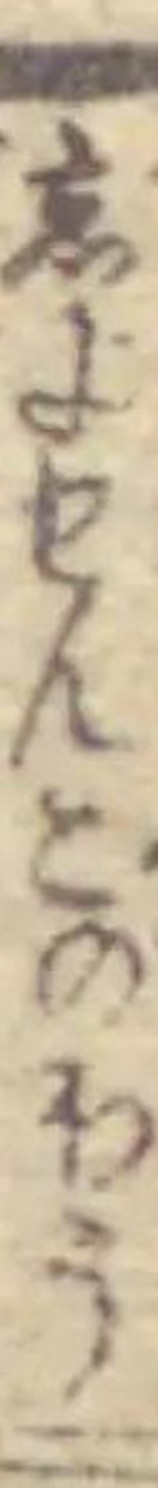しよせんこのほう
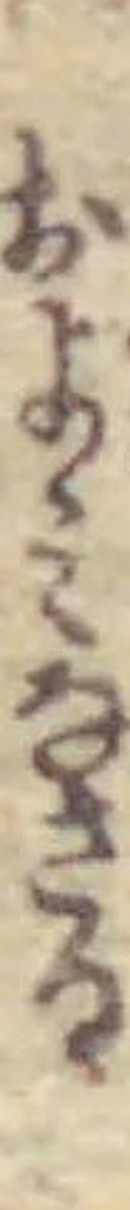およみなさる
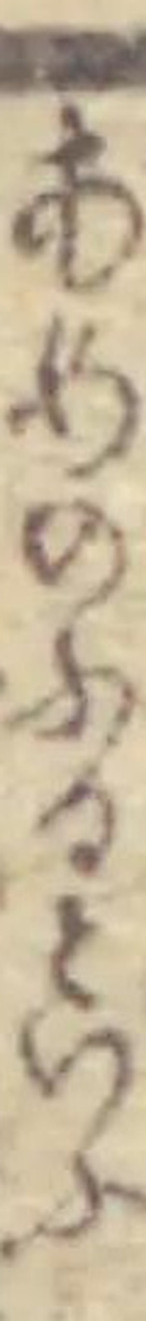あめのふるといふ
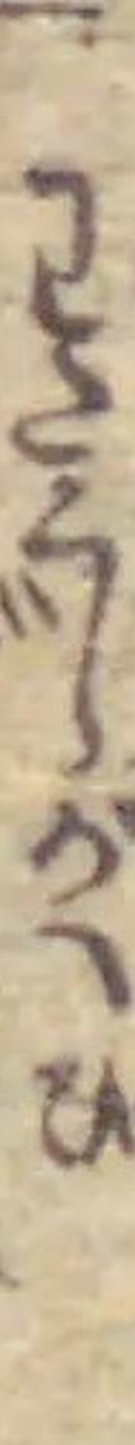わたくしがへび
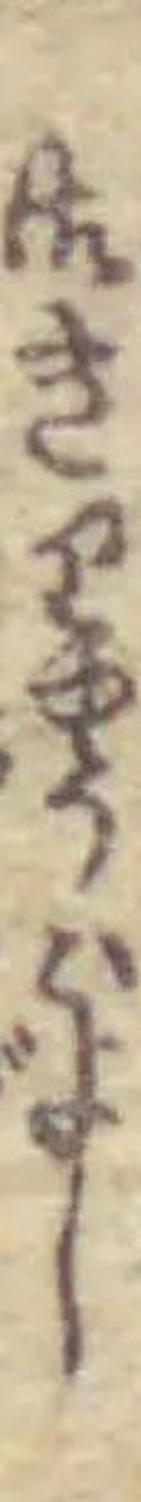御きりやうはよし
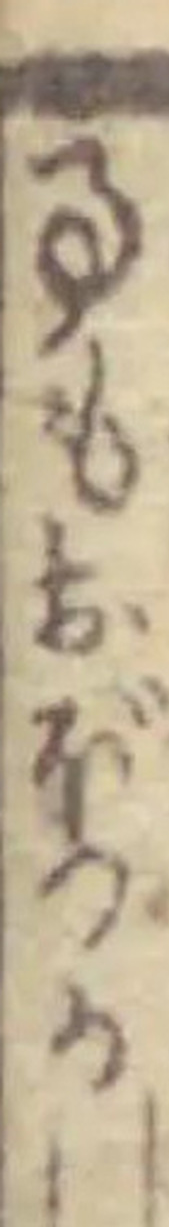事もおぼつか
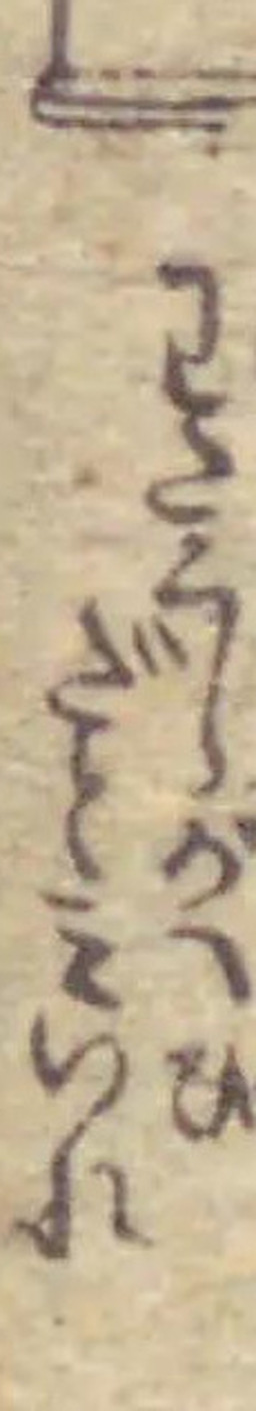だとみいれ
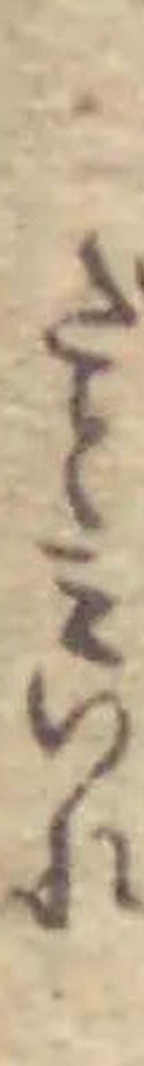だとみいれ
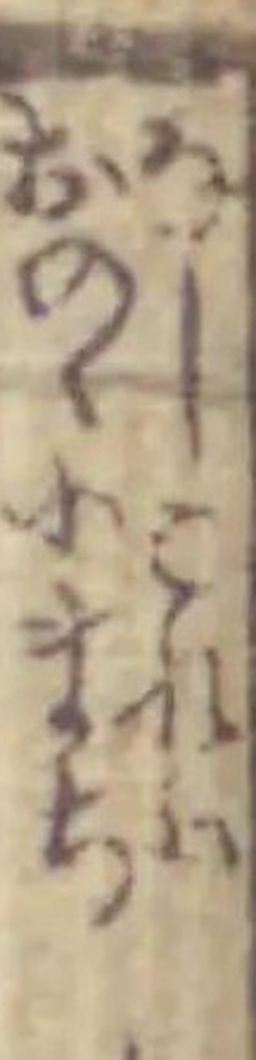おのゝ小まち
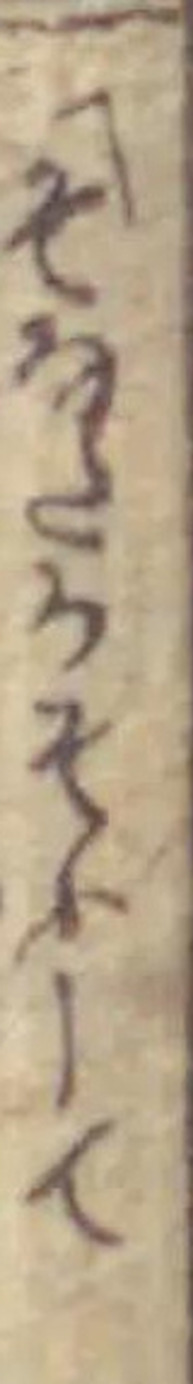〽そなたかそふして
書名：雨宮風宮出儘略縁記 3巻
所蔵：国立国会図書館 National Diet Library, JAPAN
